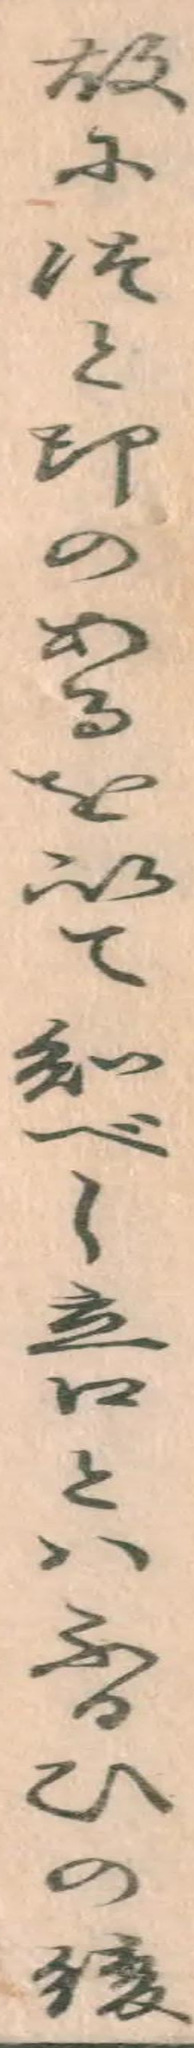故につと印のあるを以て知べし立口とはふるひの綾
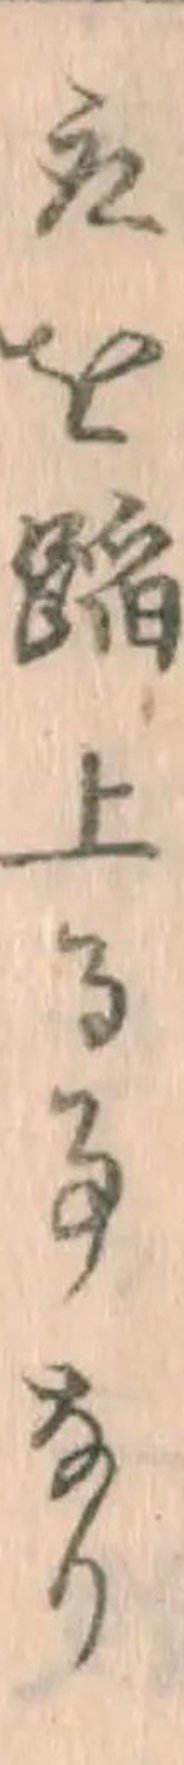取を蹈上る事なり
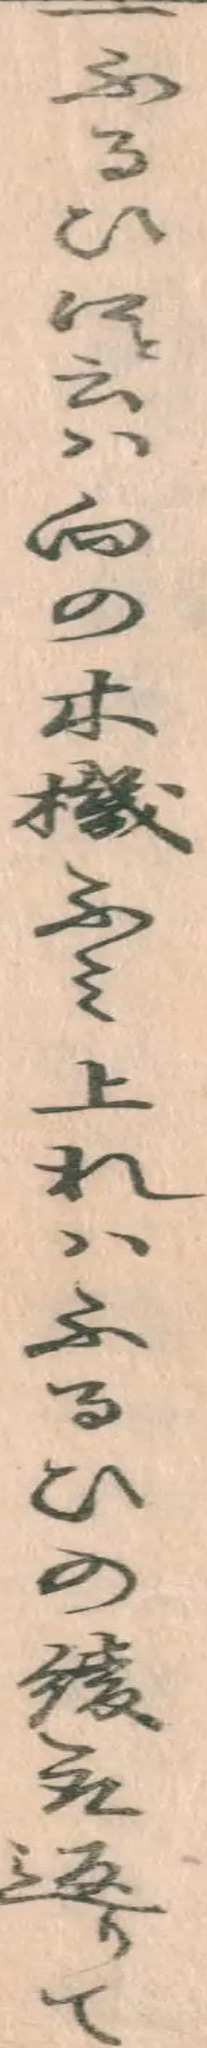一ふるひ口と云は向の木機ふみ上れはふるひの綾取返りて
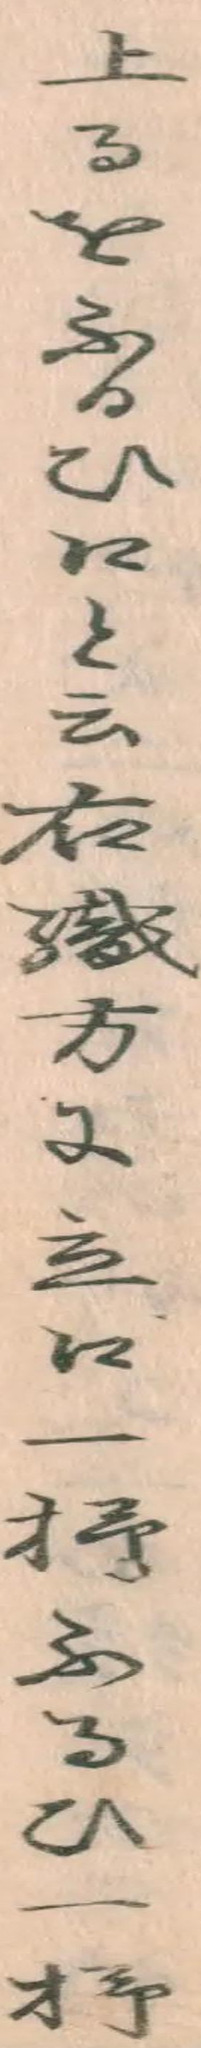上るをふるひ口と云右織方に立口一杼ふるひ一杼
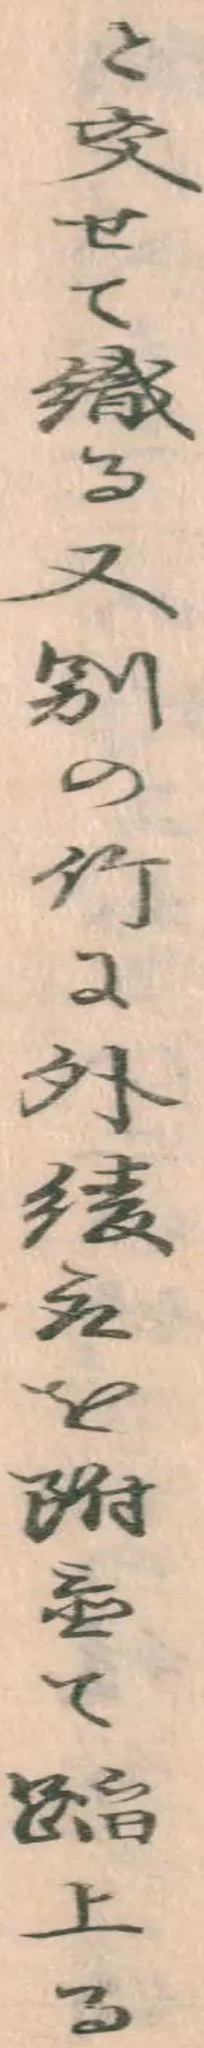と交せて織る又別の竹に外綾取を附置て蹈上る
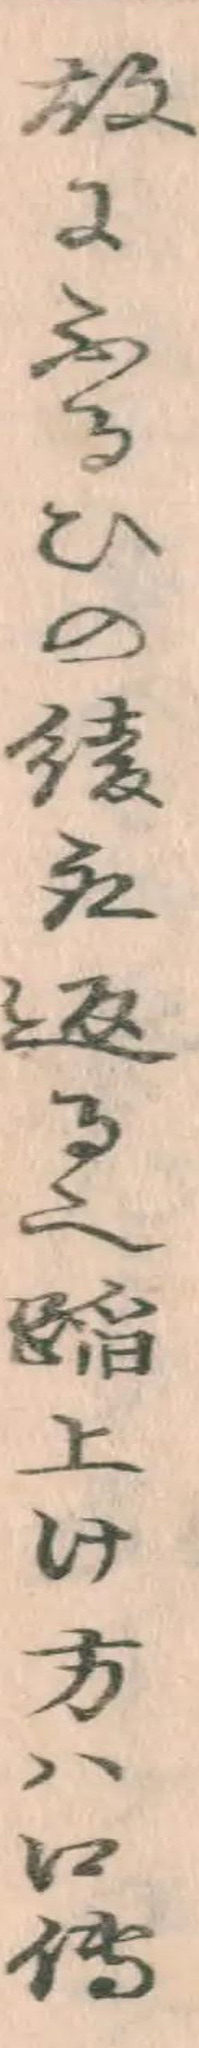故にふるひの綾取返る也蹈上け方は口伝
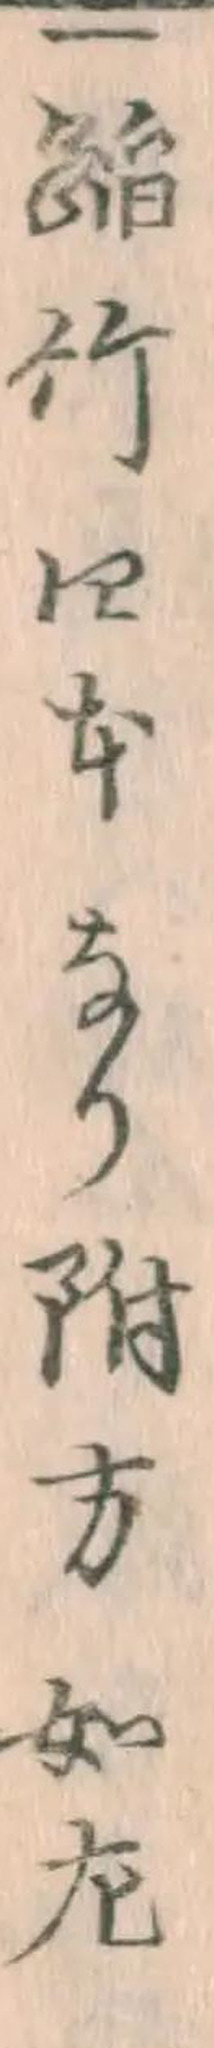一蹈竹四本なり附方如左
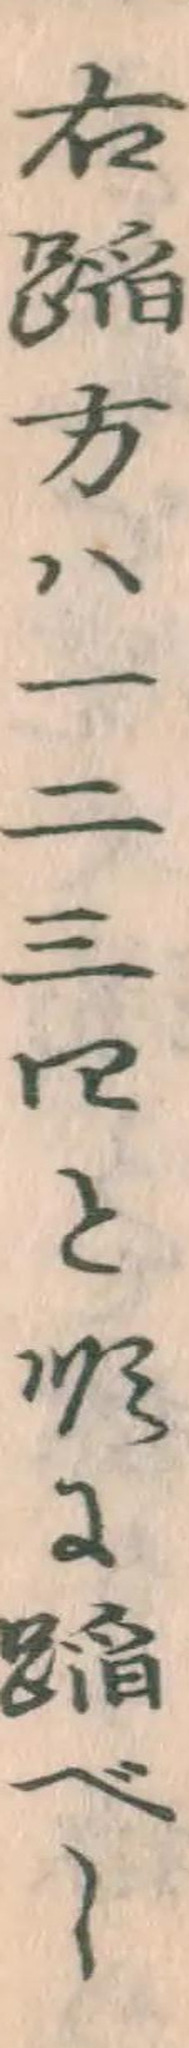右蹈方は一二三四と順に蹈べし
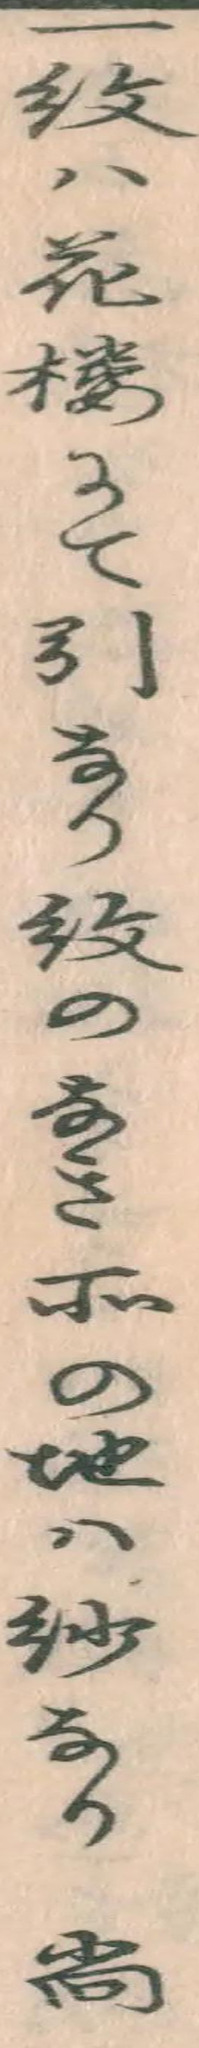一紋は花楼にて引なり紋のなき所の地は紗なり尚
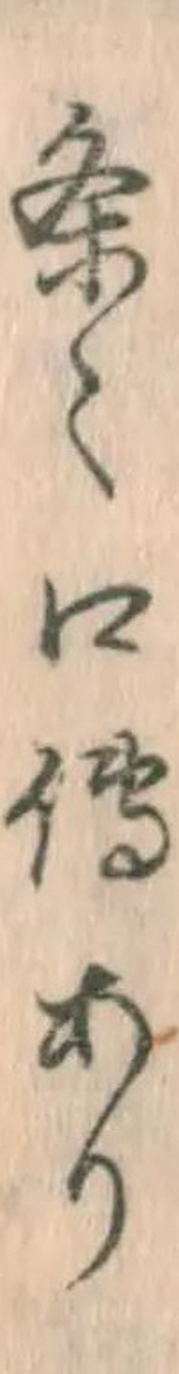条々口伝あり
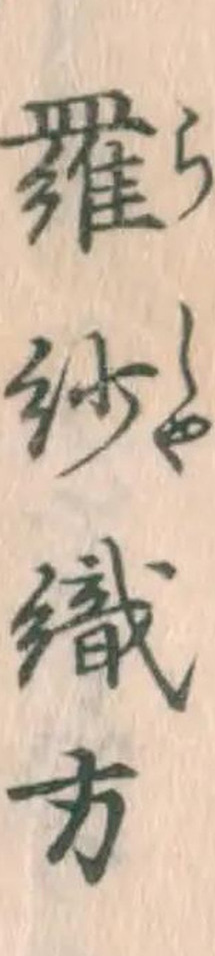羅紗織方
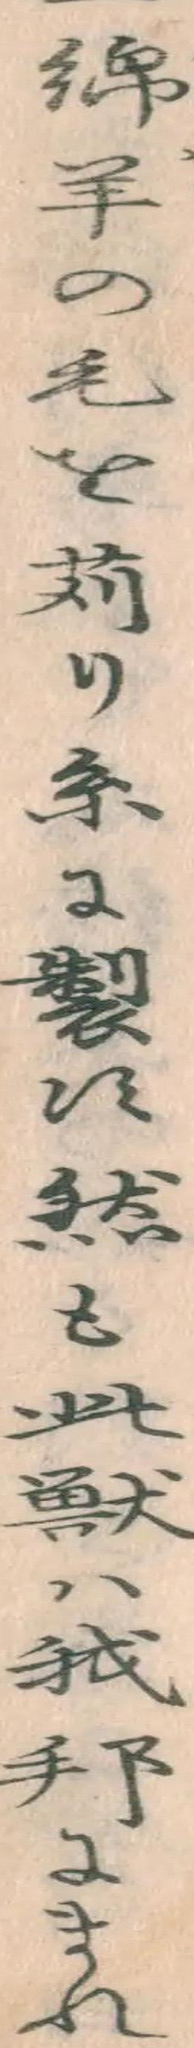一綿羊の毛を刈り糸に製す然も此獣は我邦にまれ
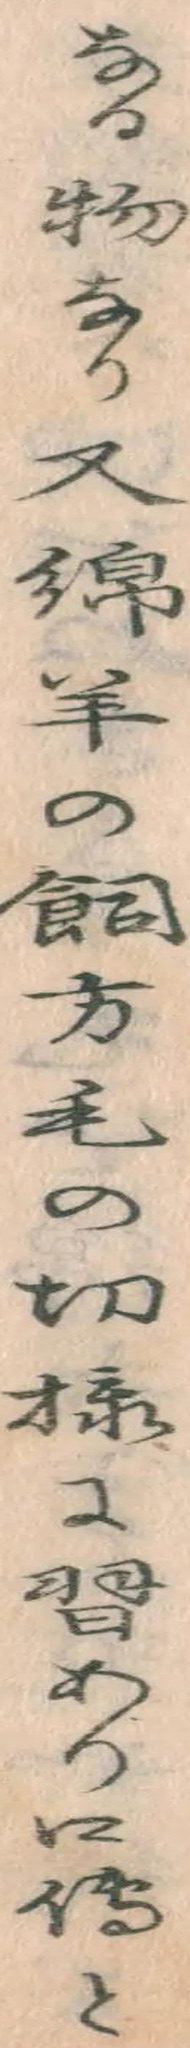なる物なり又綿羊の飼方毛の切様に習あり口伝と
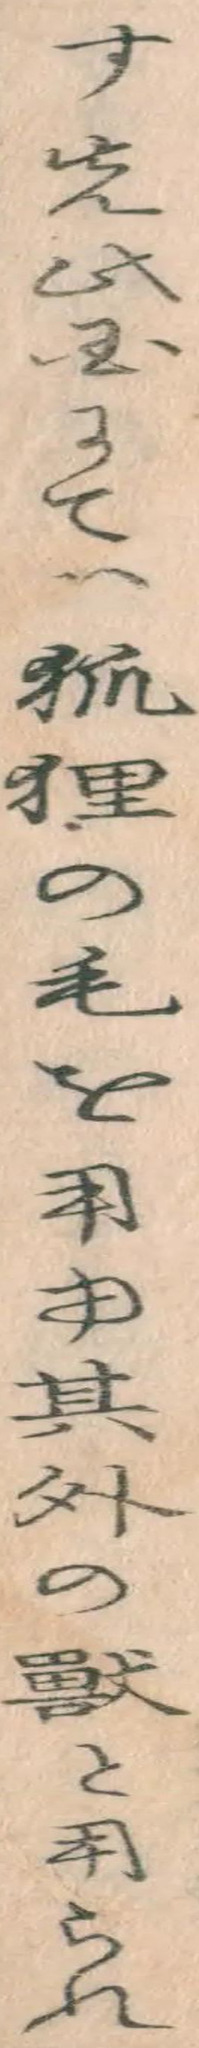す先此国にては狐狸の毛を用ゆ其外の獣と用られ

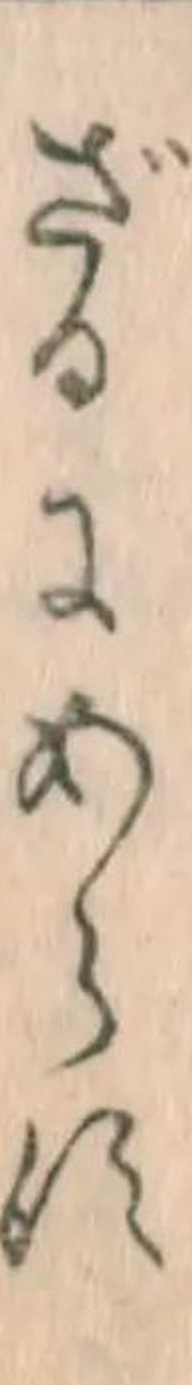ざるにあらす
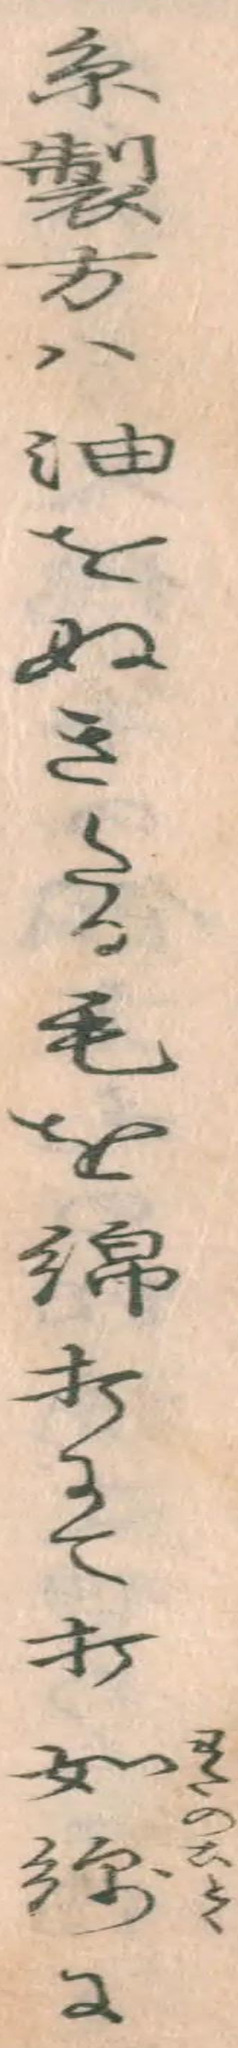一糸製方は油をぬきたる毛を綿打にて打如綿に
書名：機織彙編 5巻. [2]
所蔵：国立国会図書館 National Diet Library, JAPAN
